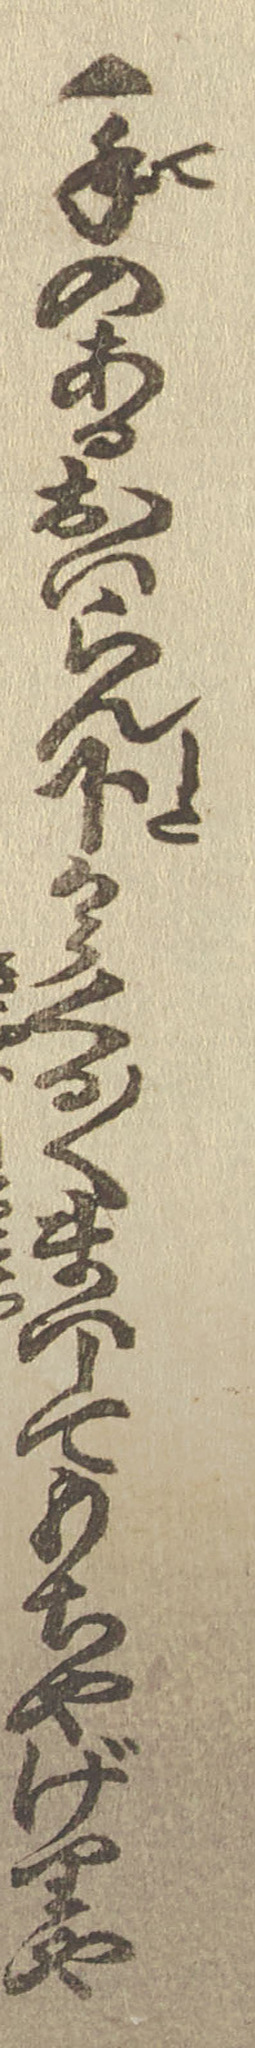手のあるおいらん下からくる〳〵まハしてもちやげりや
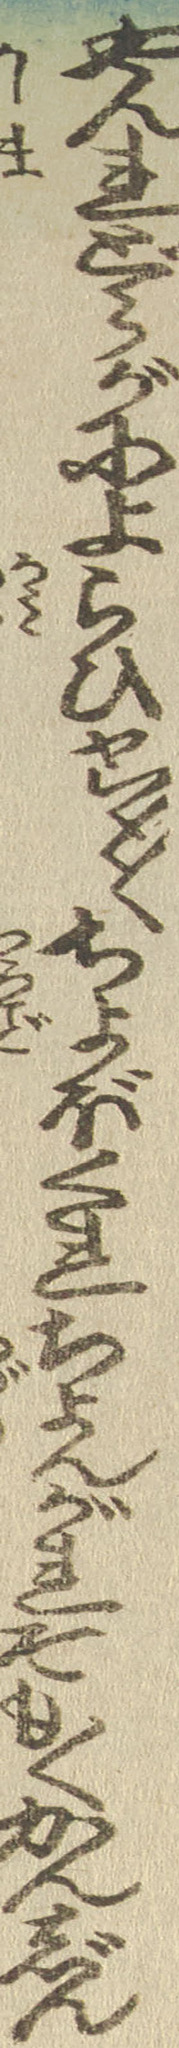やんれどらがによらひヤレ〳〵〳〵〳〵ちよぼくれちよんがれそも〳〵かんじん
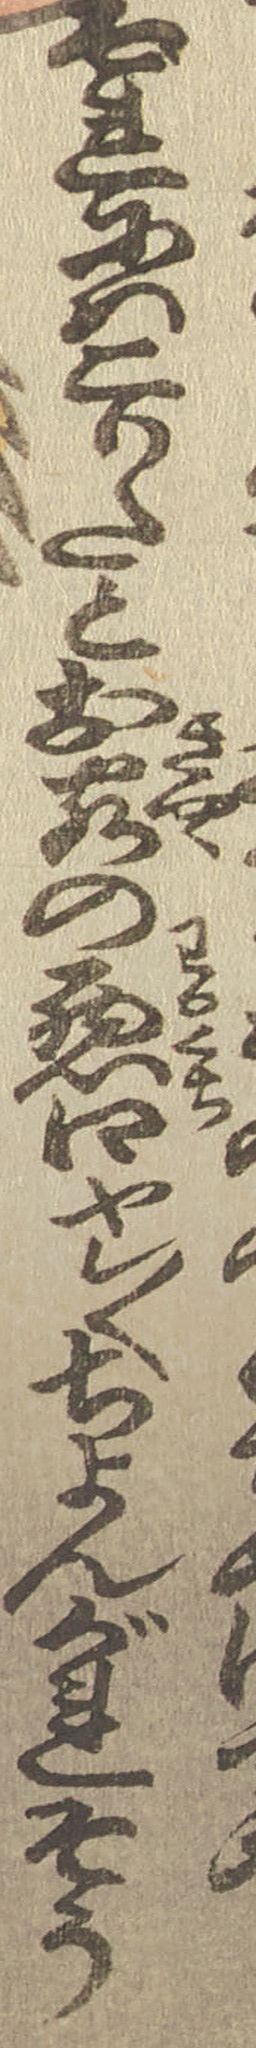それにハこりたとお客の悪口ヤレ〳〵ちよんがれそう
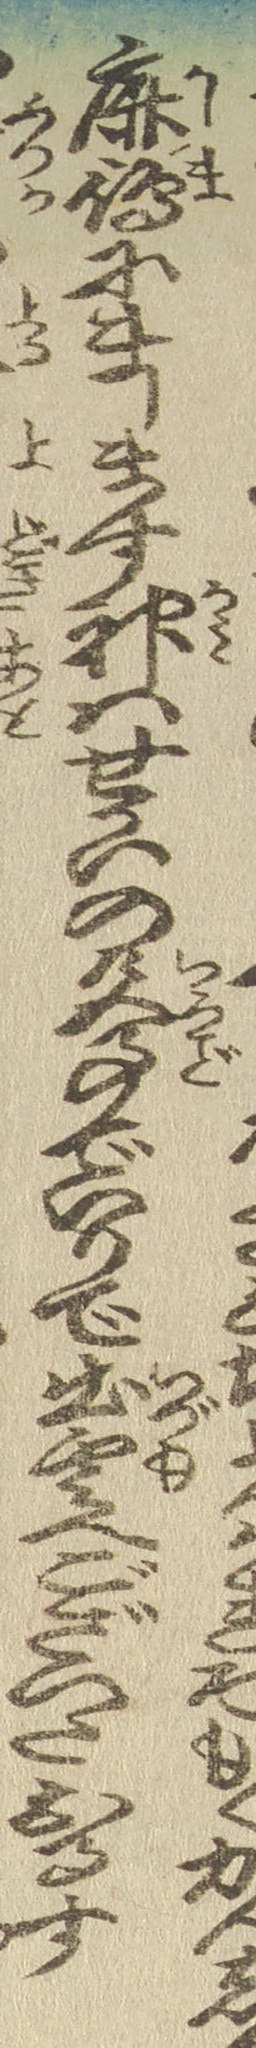鹿嶋にまします神はせかいの色事でいりで出雲へござつたおるす
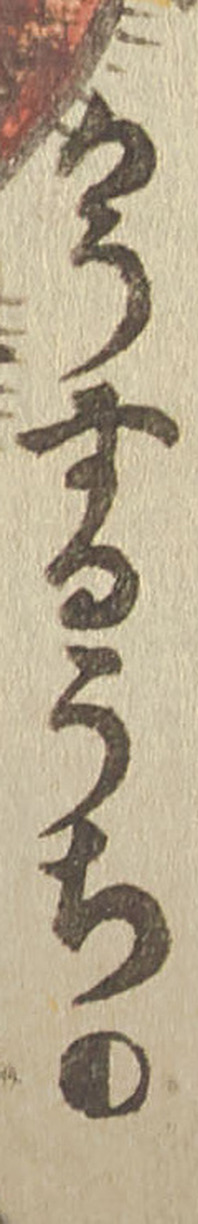かうするうち
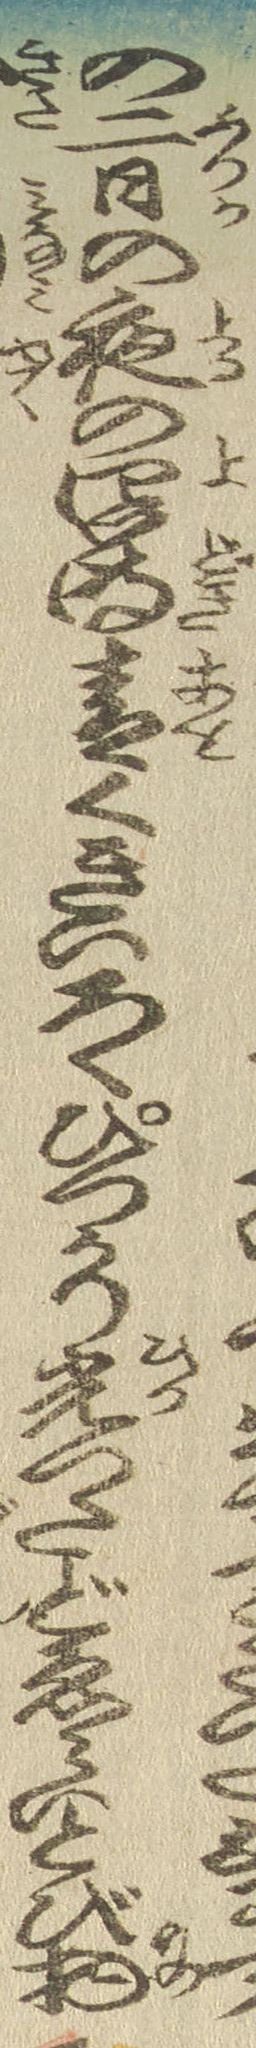の二日の夜の四ツ時青くきろくぴつかり光つたどゑらいとび物
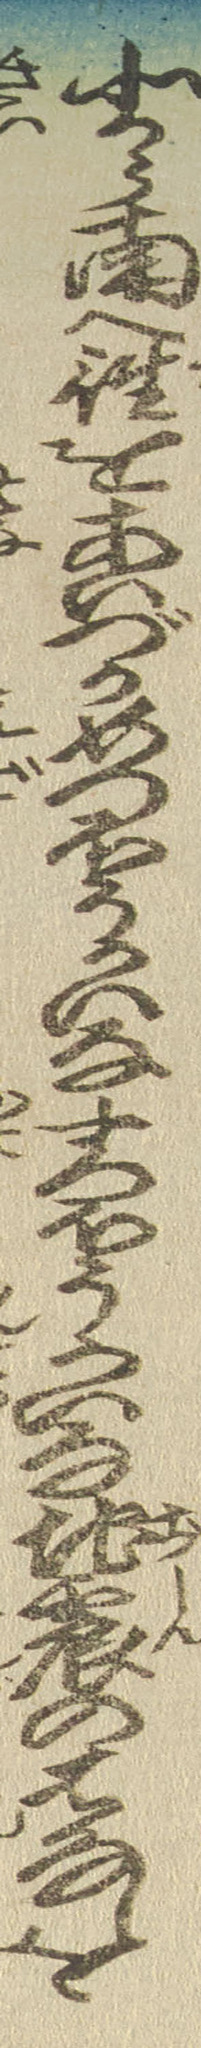北から南へ往をあいづかめつほうかいなまつほうかいな地震のはなしを
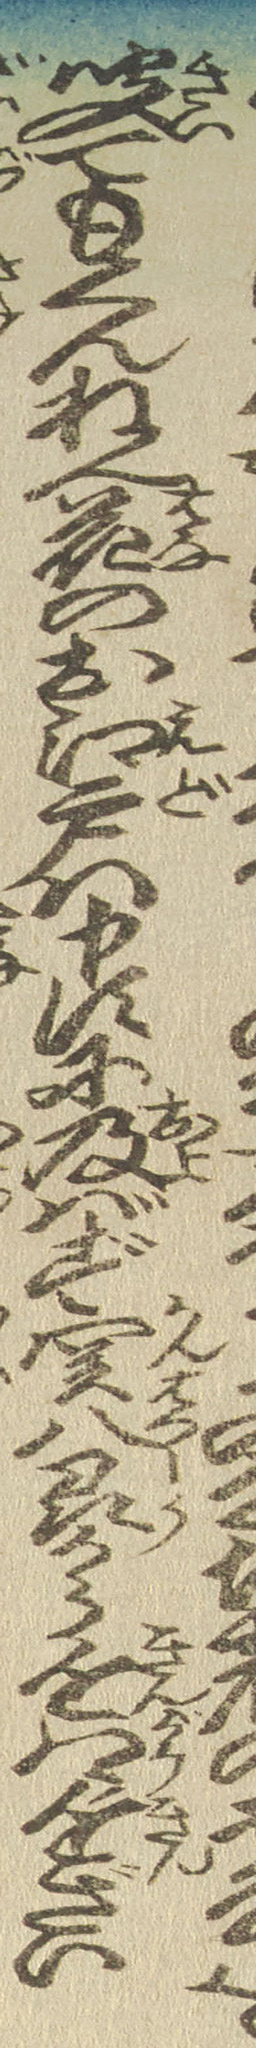聞てもくんねへ花のお江戸ハ申すに及バず関八刕から近郷近ざい
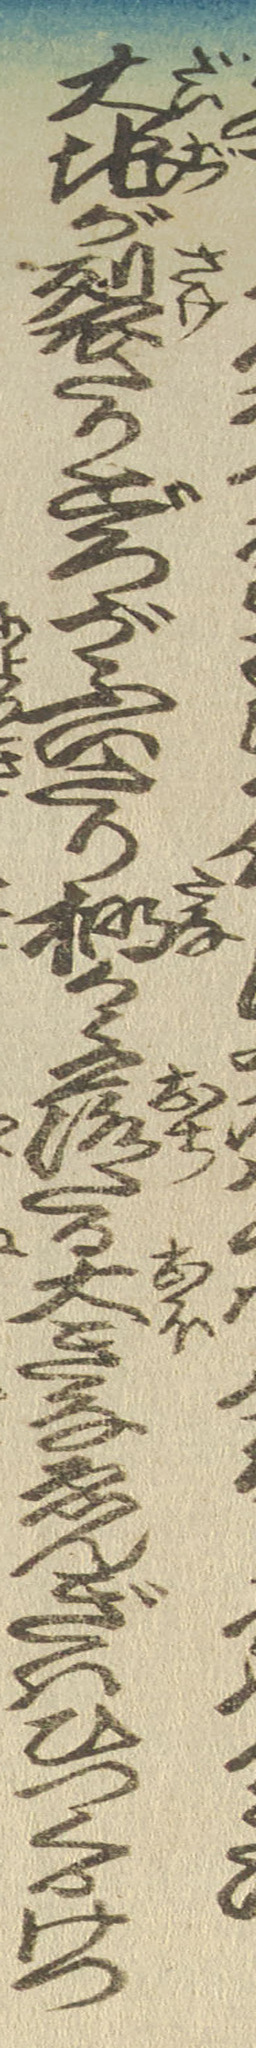大地が裂たりどろがふいたり棚から落たる大きなゑんぎハひつくるけつ
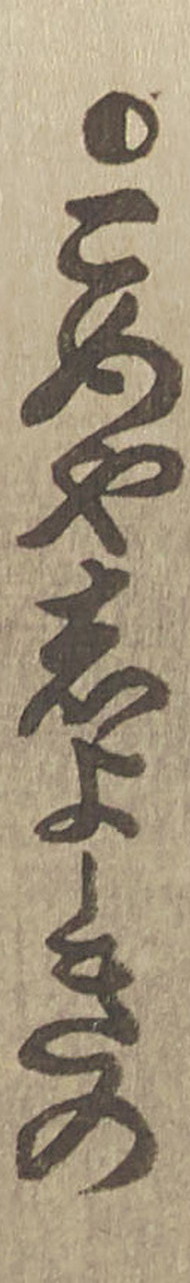こめやしよしきの
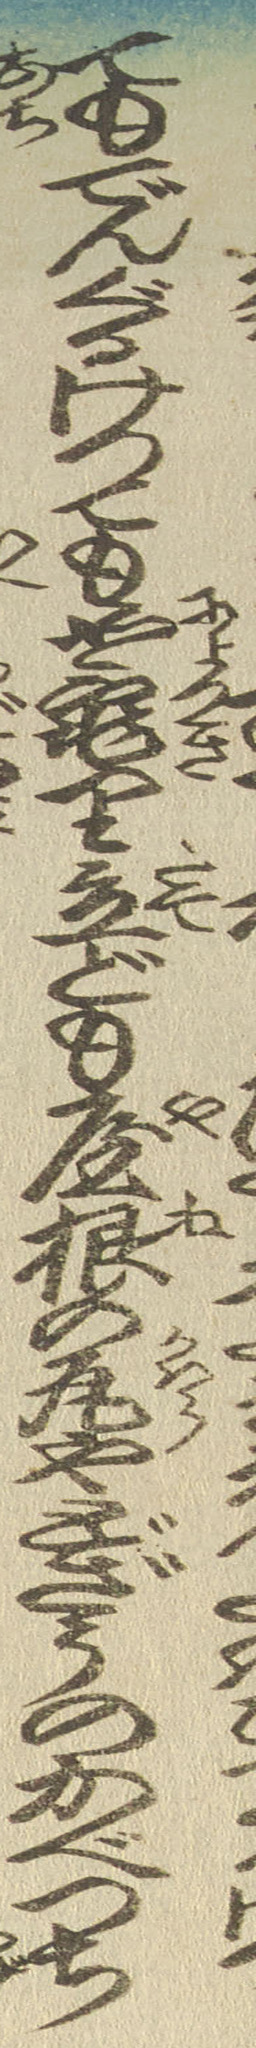てもでんぐるけつても如亀り立ども屋根の瓦やどざうのかべつち
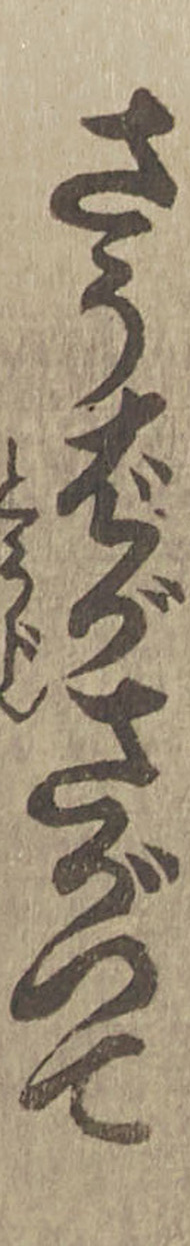さうばがさがつて
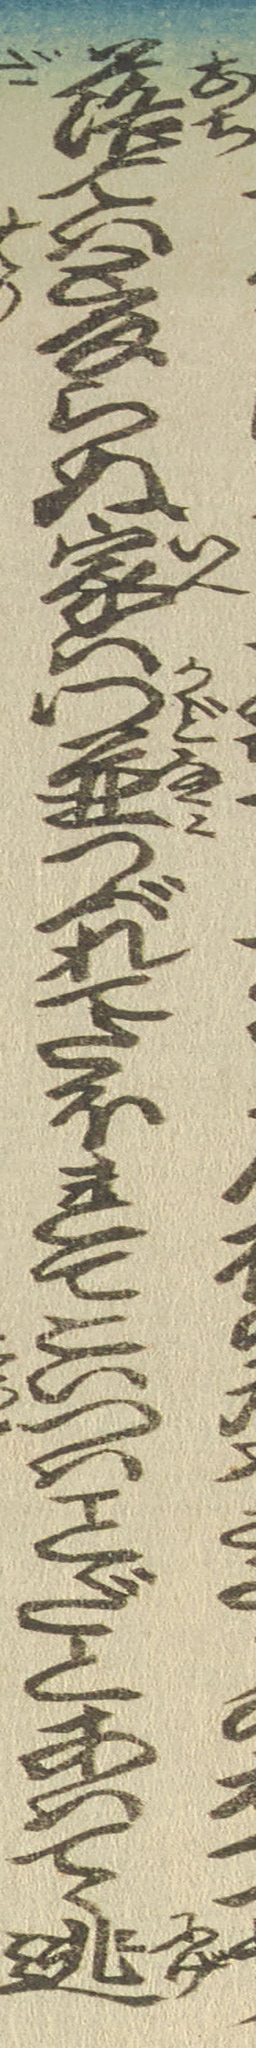落てハたまらぬ家ハ門並つぶれてたほれてこいつハことだとあハてゝ逃
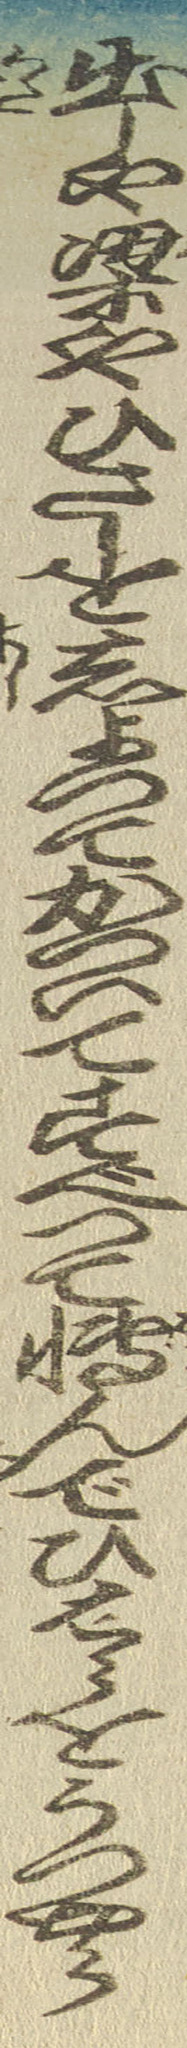出しや梁やひさしをしよつてかついてすべつて轉んでひはらをうつやら
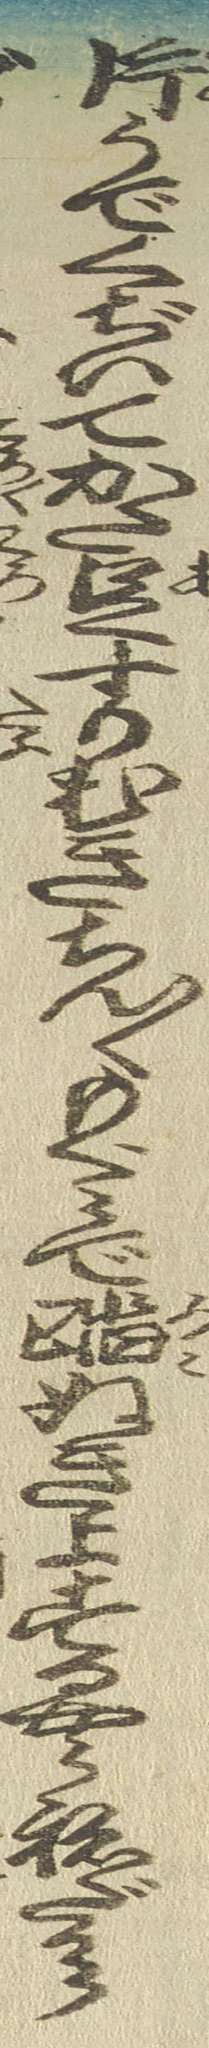片うでくぢいてかた足すりむきちん〳〵もか〻で踏ぬきよするやらねだから
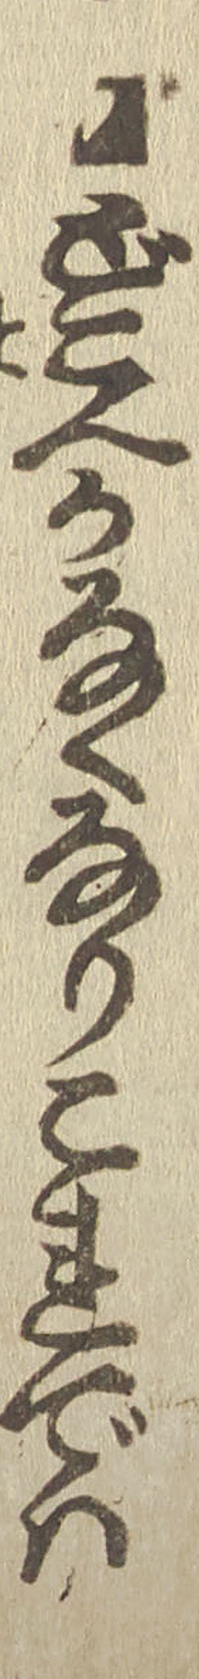どこへかなくなりこれでハ
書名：どらが如来世直し ちょぼくれ
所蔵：東京大学総合図書館 General Library in the University of Tokyo, JAPAN
